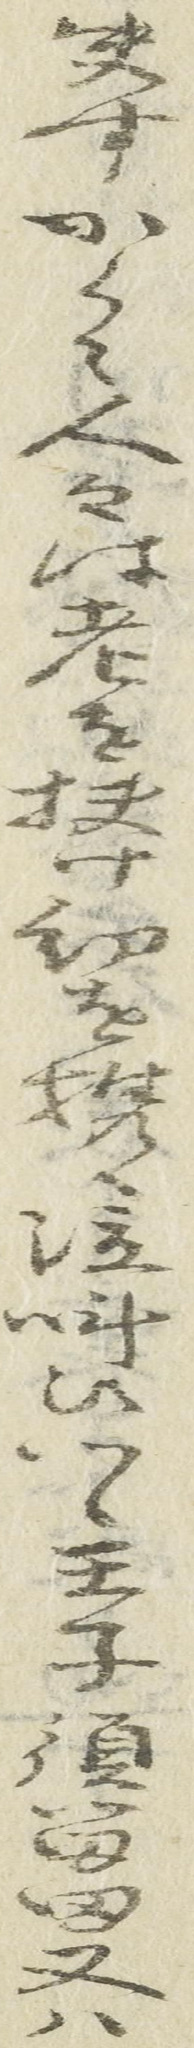失すかくて人々は老を扶け幼を携ヘ泣叫ひツヽ王子須留田又ハ
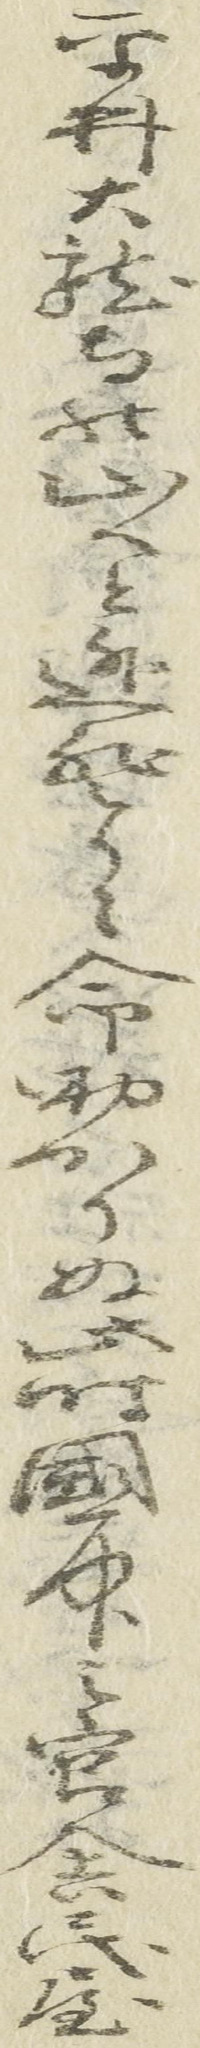平井大龍寺の山へと逃登りて命助かりぬ此時国中之官舎民屋
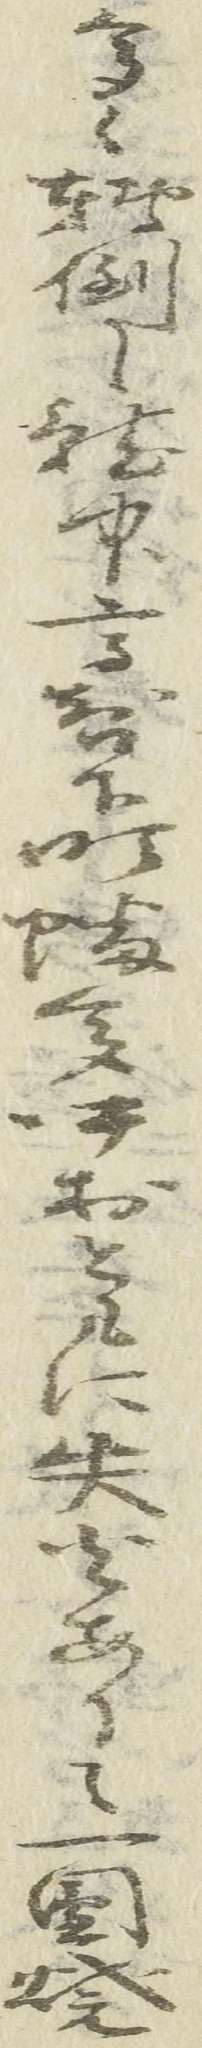多く転倒し就中高智下町幡多中村ともに失火ありて一円焼
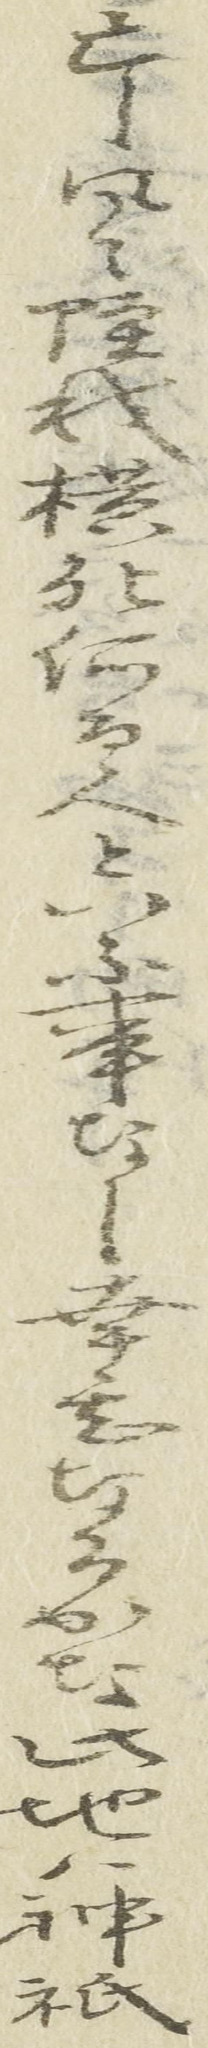亡し凡そ怪我横死何百人といふ事なし幸甚なるかな此地ハ神祇󠄀
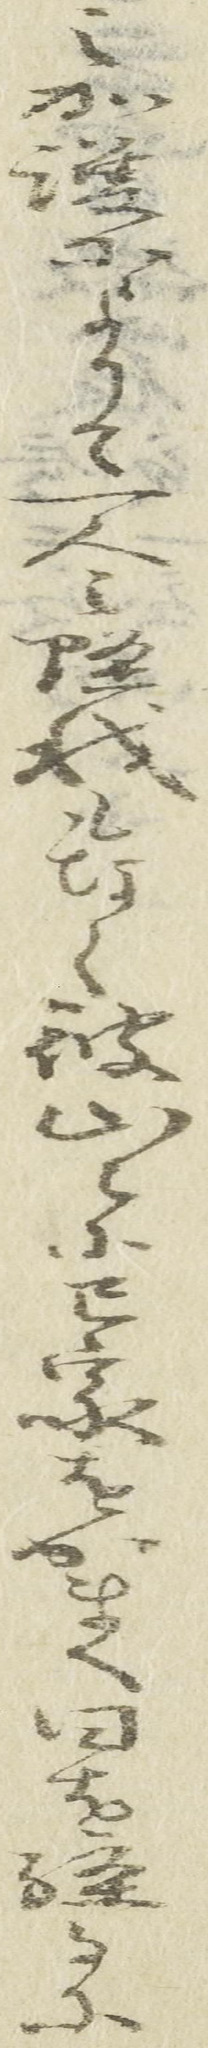之加護によりて一人之怪我もなく彼山〻に己家をかまへ日を経るに
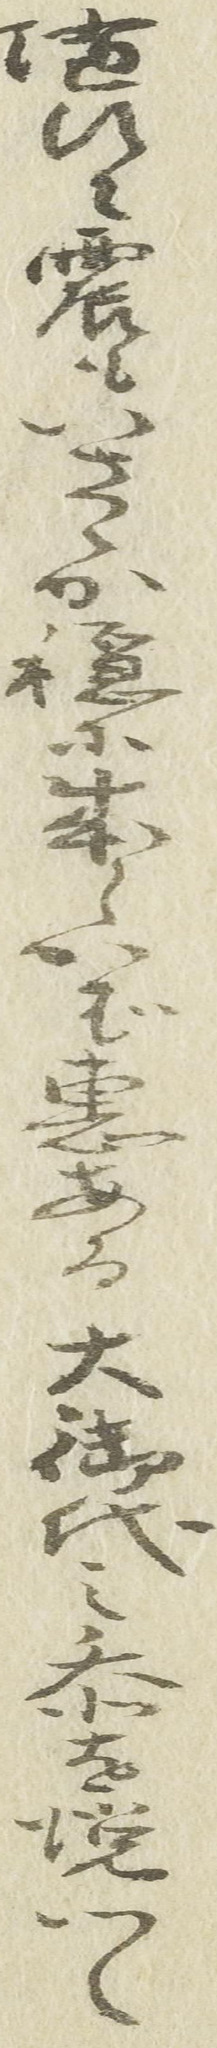随ひて震もいさゝか穏に成しかば恵ある大御代之忝を悦ツヽ
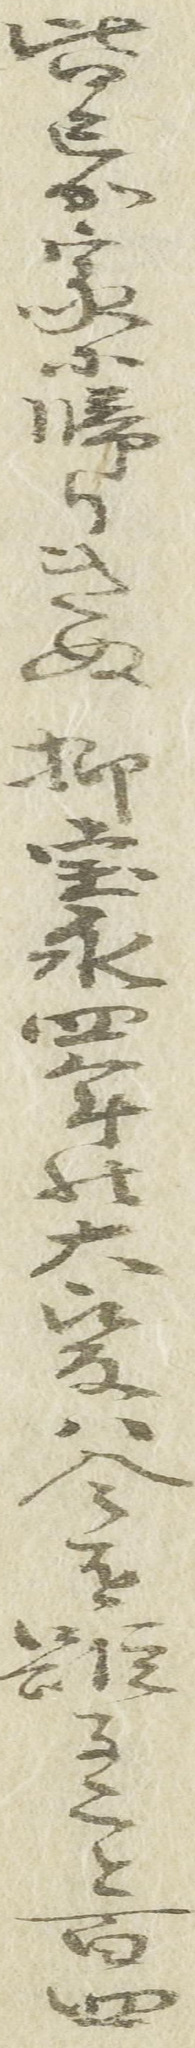皆己が家に帰りきぬ抑宝永四年の大変ハ今を距ること百四
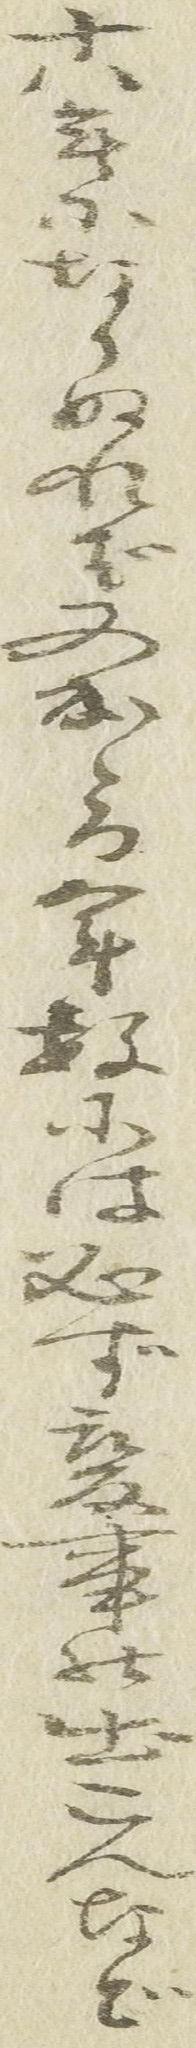十八年になりぬれば又かゝる年数には必ず変事の出こんなど
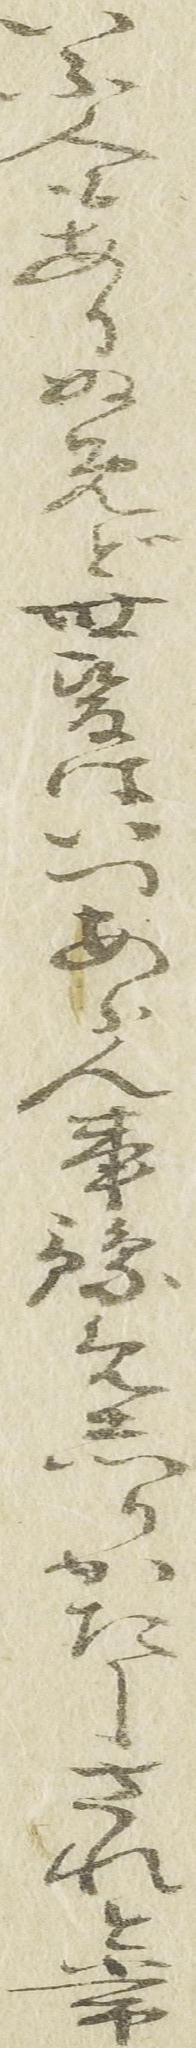いふ人もありぬめど世変はいつあらん事予めしりかたしされと常
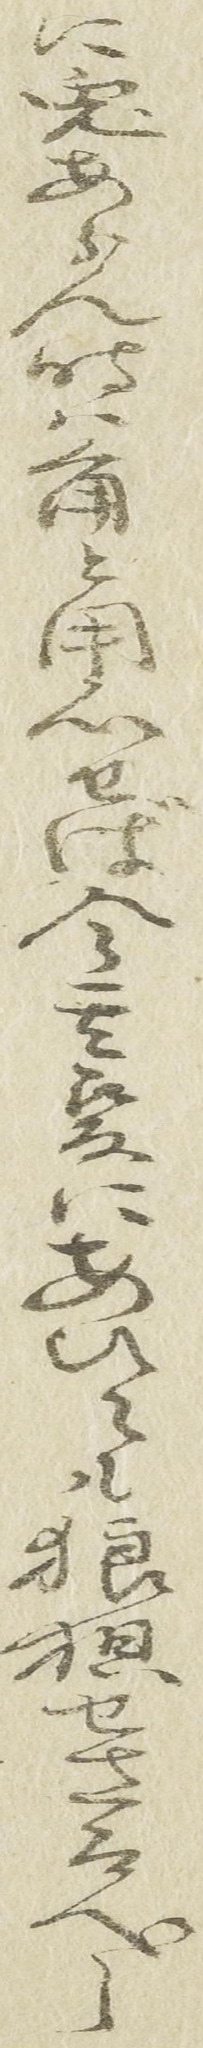に兔あらん時ハ角と用心せば今其変にあひても狼狽せさるべし
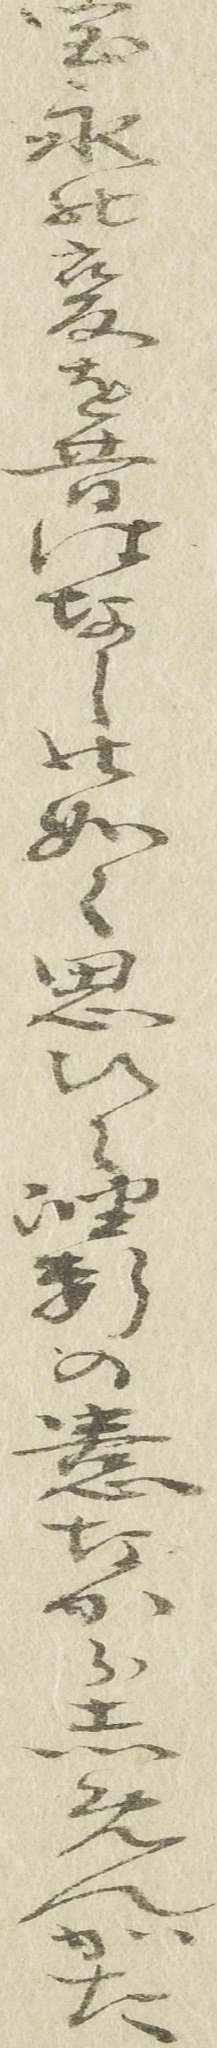宝永の変を昔はなしの如く思ひし油断の患なからしめんがた
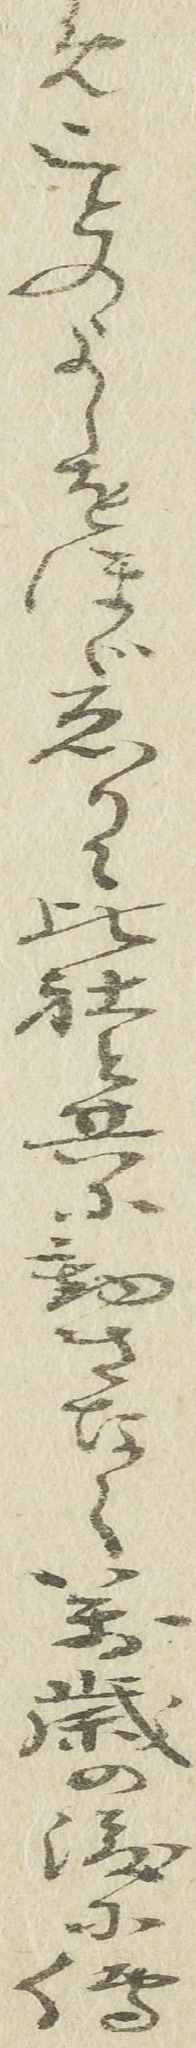めことのよしをほゞゑりて此社と共に動きなく萬歳の後に伝
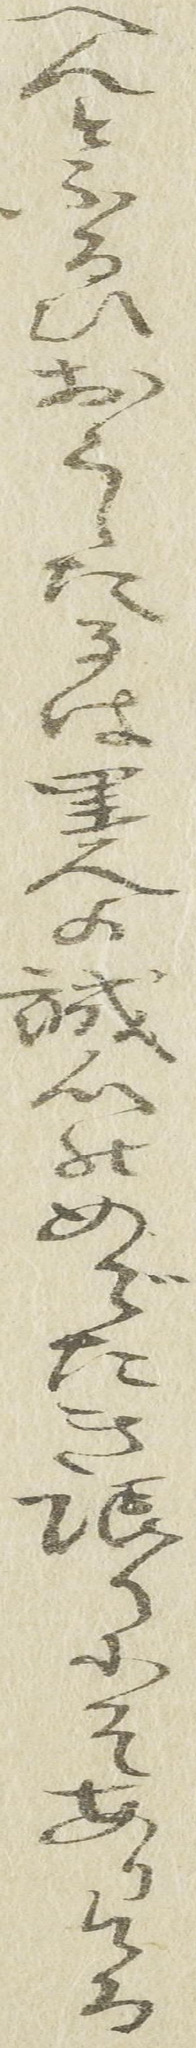へんとふるひおこしたるは里人の誠心のめでたき限りにそありける
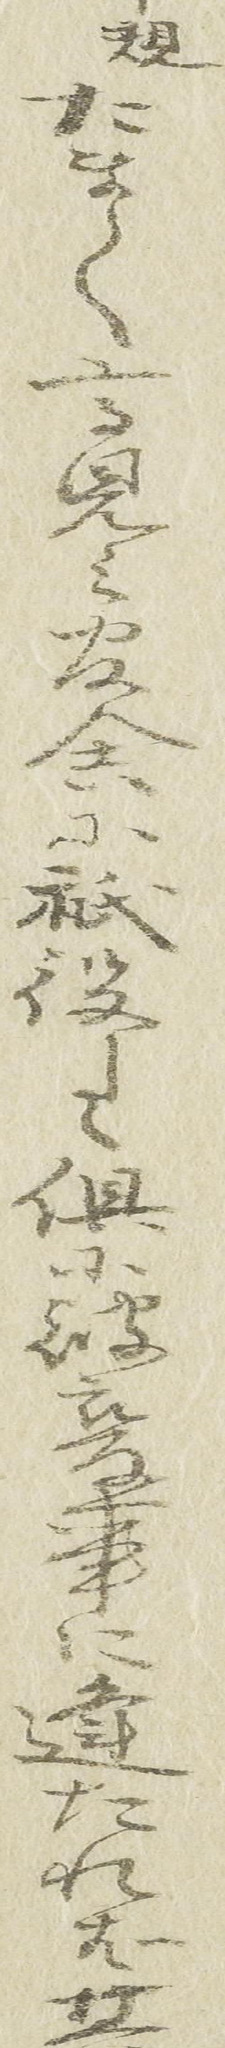千規たま〳〵高見の官舎に祇役して倶に彼変事に逢たれば其
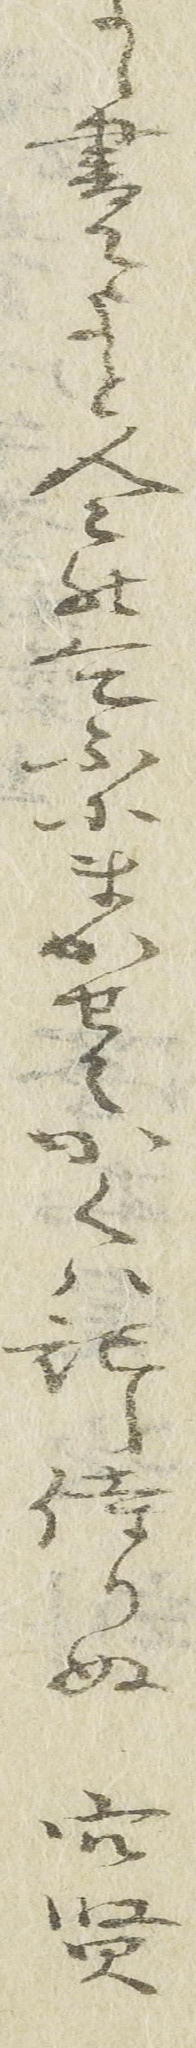よし書てよと人〻の乞ふにまかせてかくハ記し侍りぬ穴賢
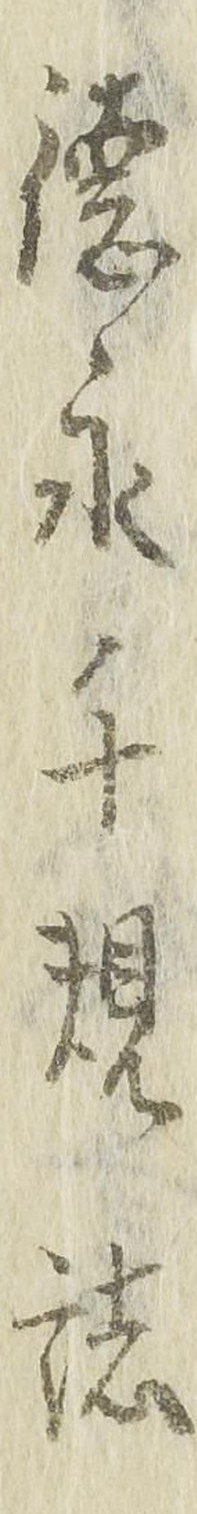徳永千規誌
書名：地震前兆集　全
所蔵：東京大学地震研究所図書室 Earthquake Research Institute Library, The University of Tokyo, JAPAN
